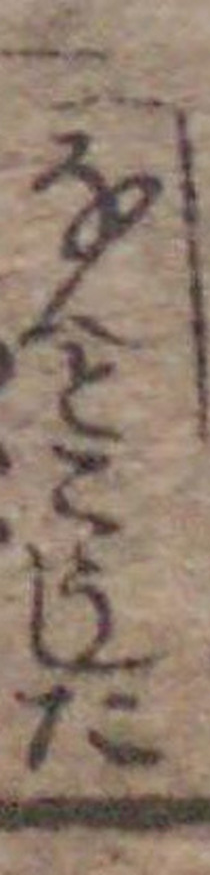〽なんとこうした
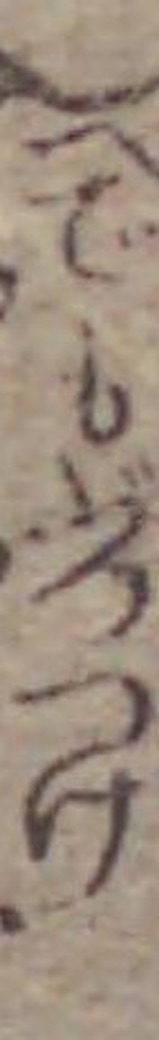へでもぶつつけ
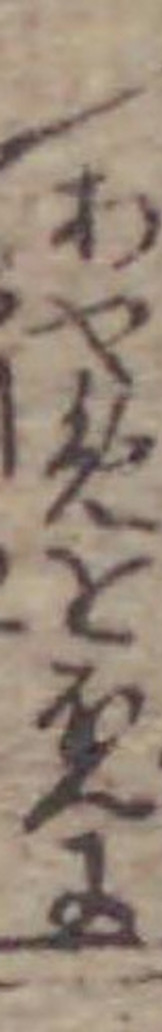あやめをほんに

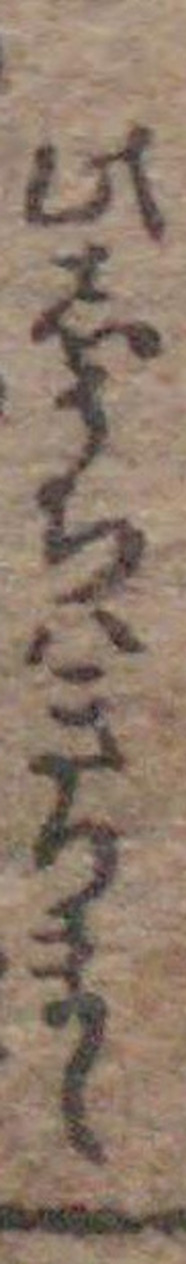此しうちはきりまし？
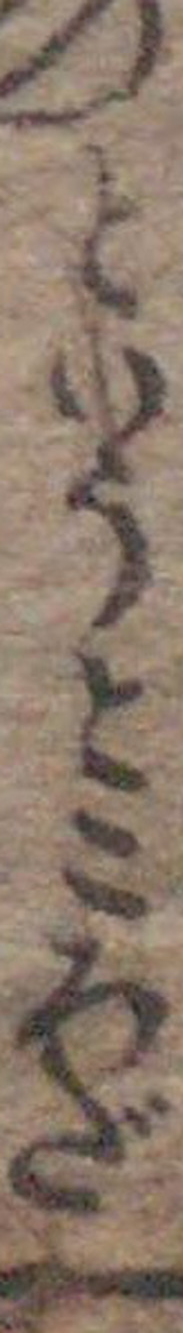というところだ
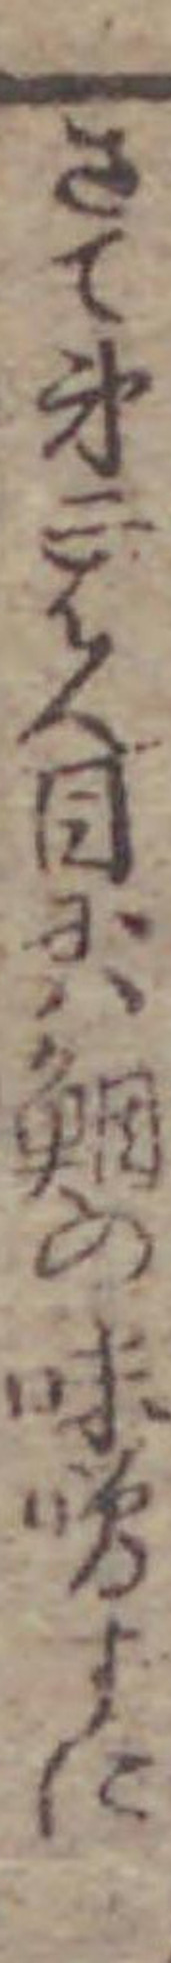さて第二はん目には鯛の味噌すに
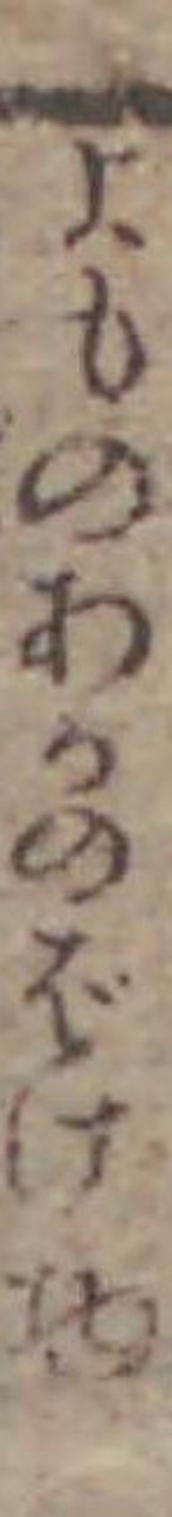よものあかのばけ物
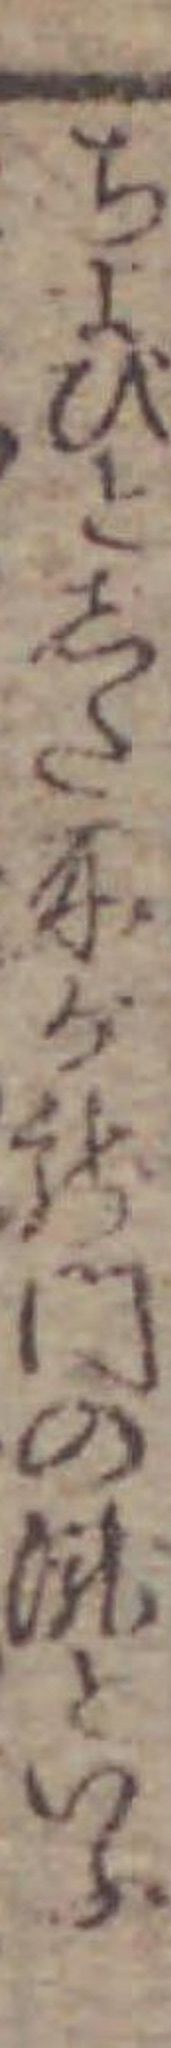ちよびとした所が龍門の瀧といふ
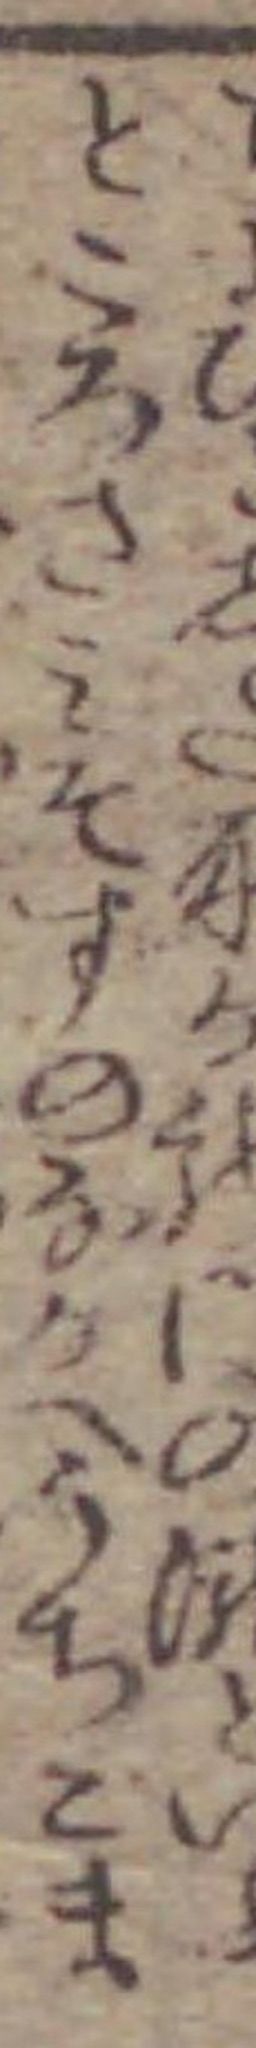ところさみそずのなかへうちこま
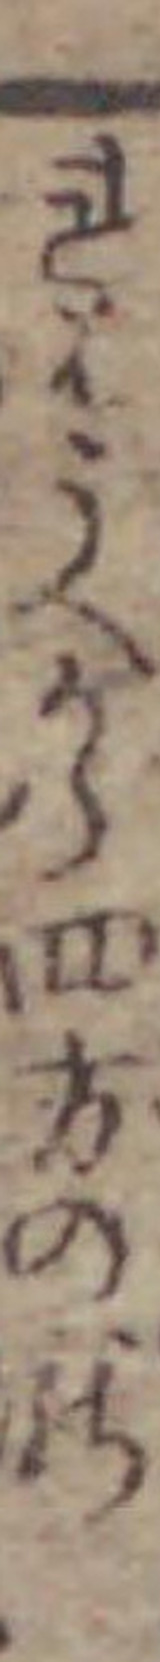れはうへから四方の瀧
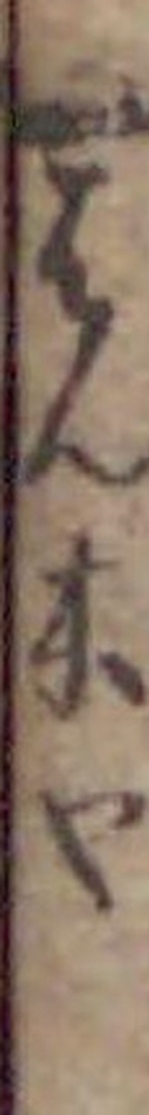はん木や
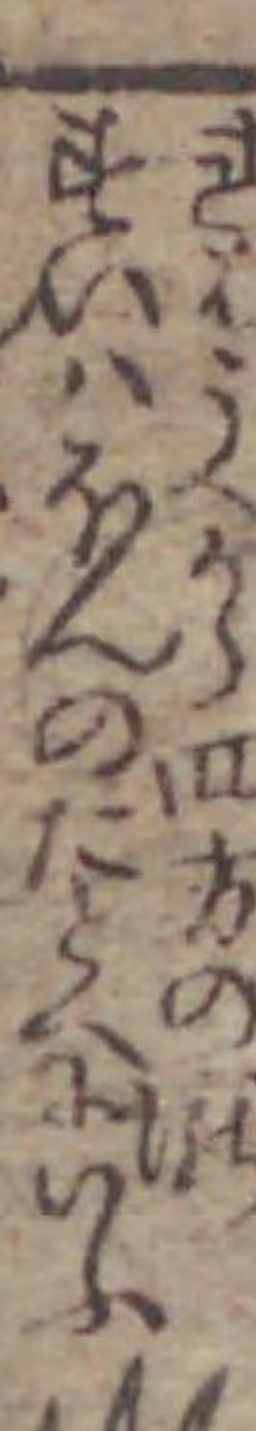すいはほんのたとへにいふ
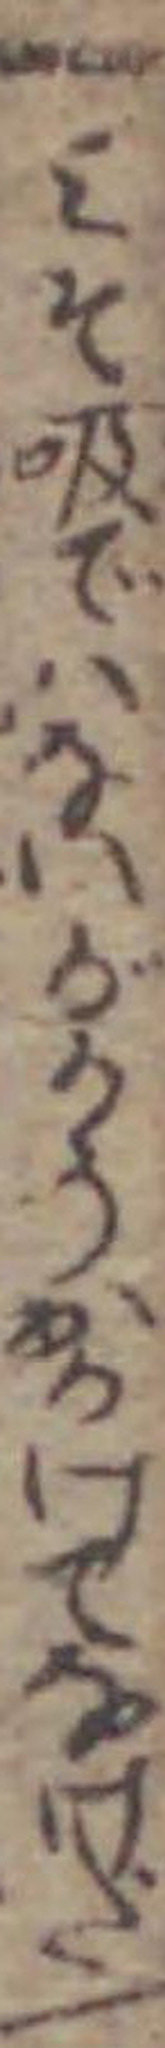みそ吸ではないがかう出かけてなげた
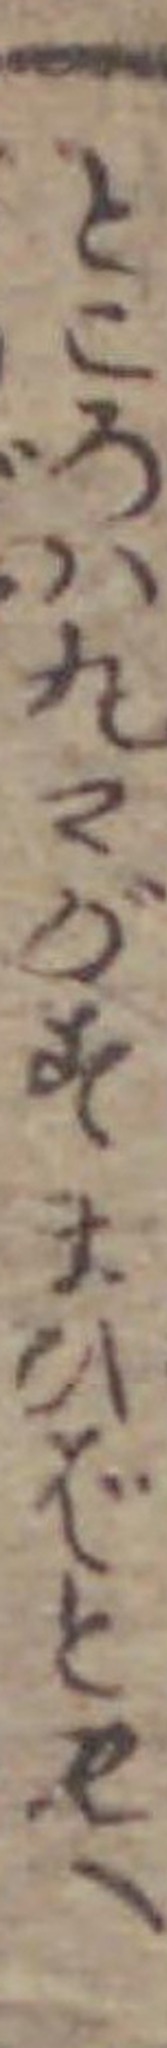ところは丸やがすまひばと見へ
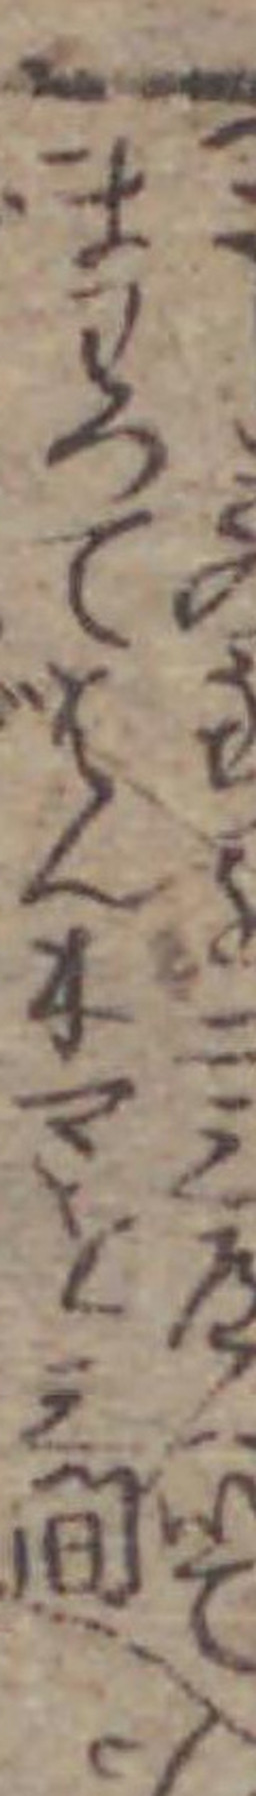まわつてはん木やを三間
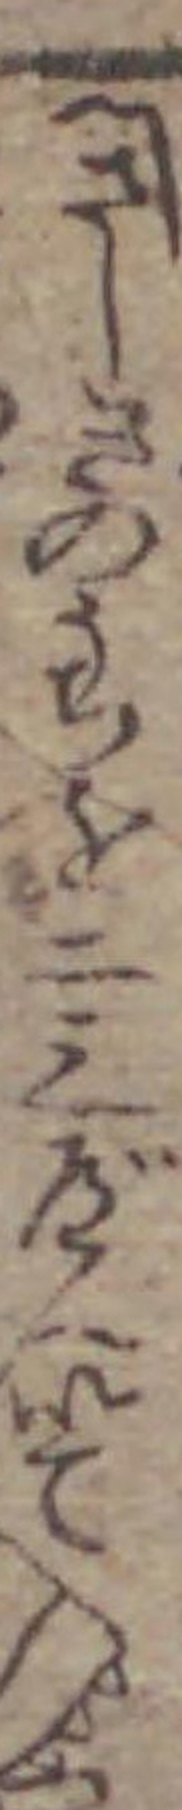〽さしきのうちを二三べん以て
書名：辞闘戦新根 （国会）
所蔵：国立国会図書館 National Diet Library, JAPAN
